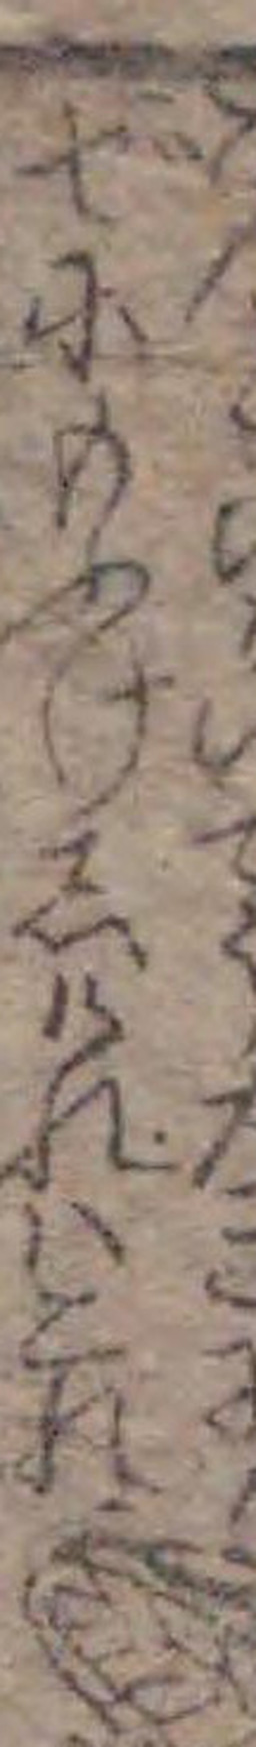ぜにもふけしけれはこれ
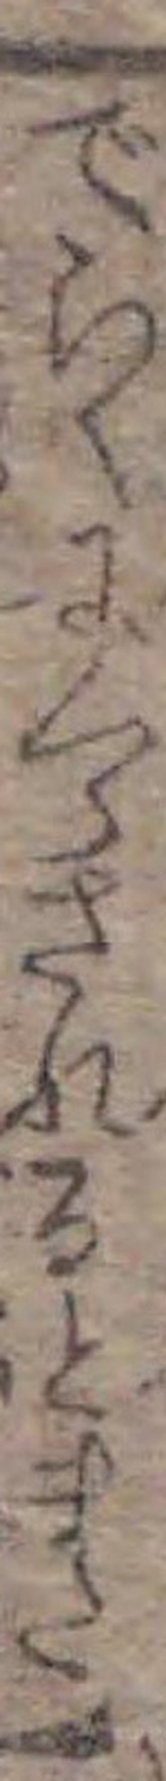でらくにくらされるとまた
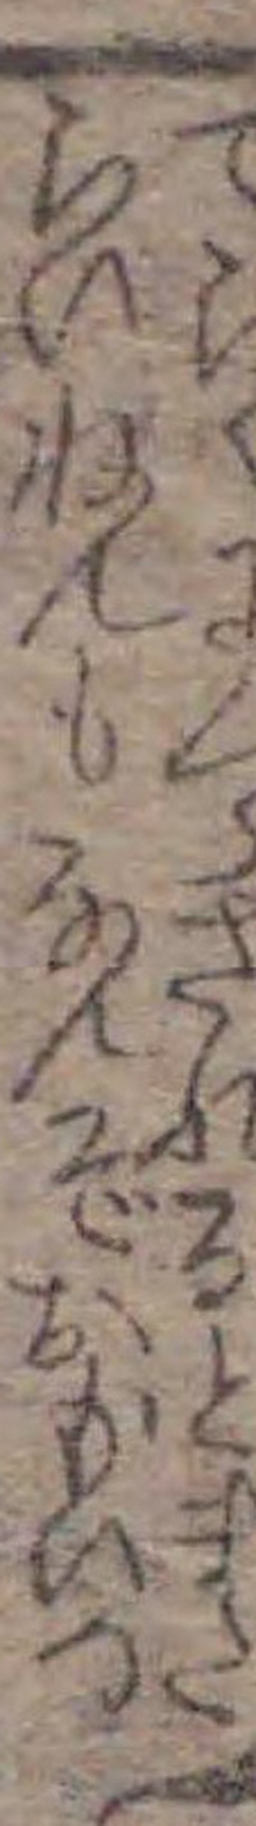らいねんもなんぞおもいつ
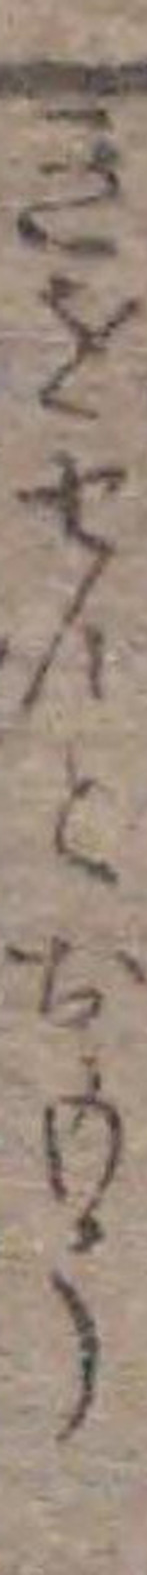きをせんとおもう
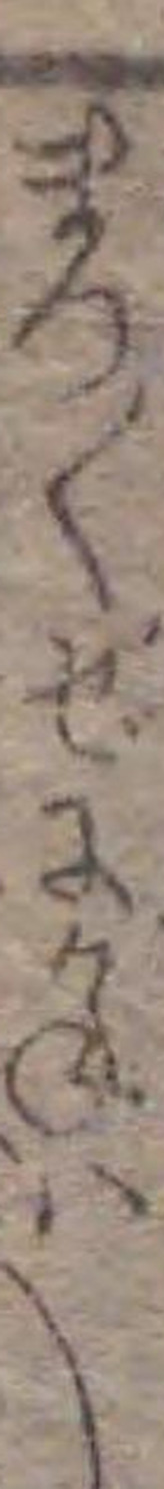まつ〳〵ぜにかねは
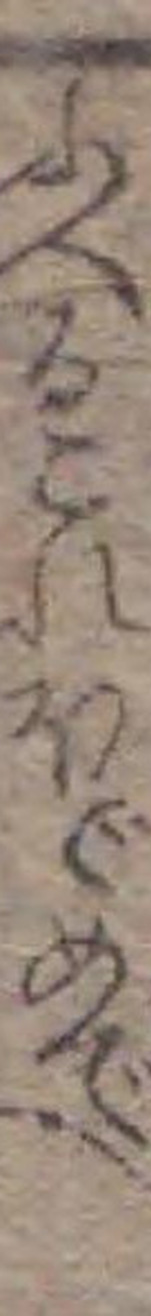ふへるこれほどめで
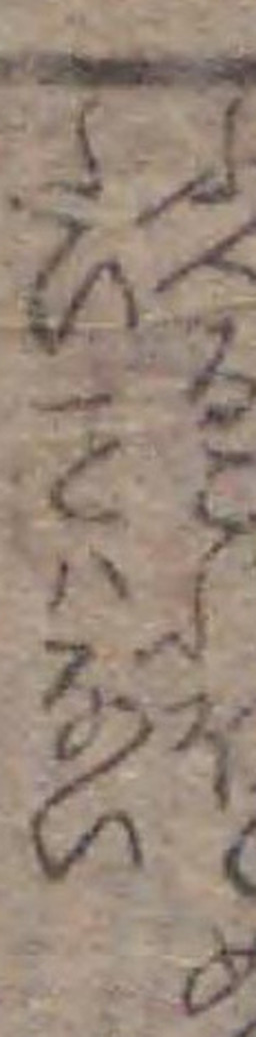たいことはない
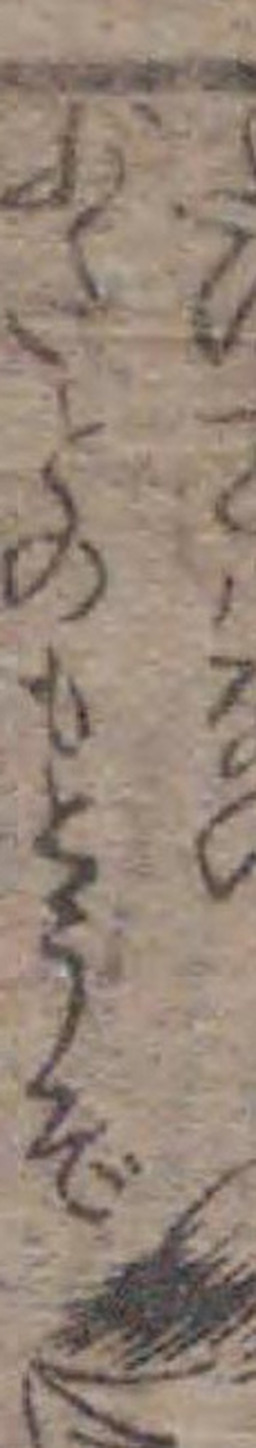ぶたとのもとうぞ
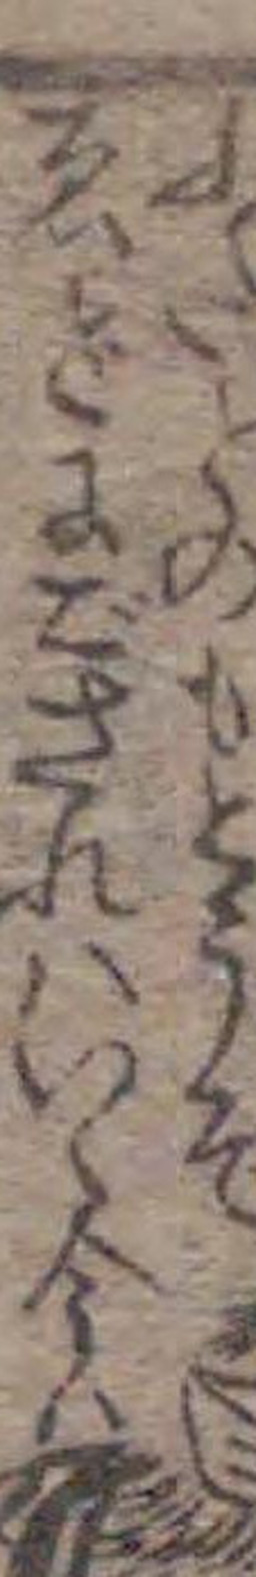ゑどにござれはいゝ今は
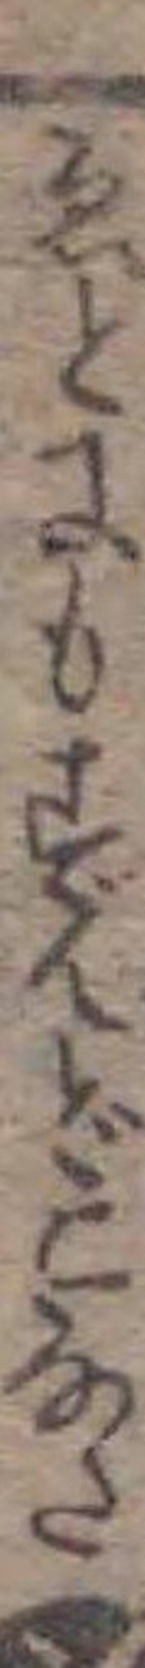ゑとにもずんどこなた
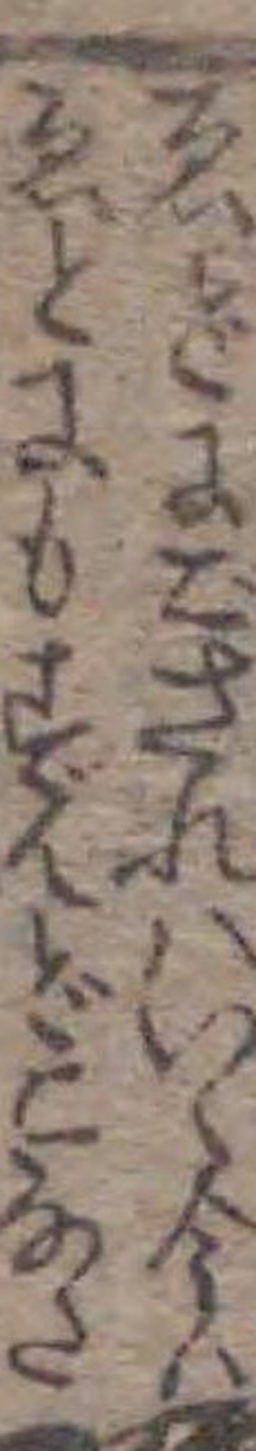ゑとにもずんどこなた
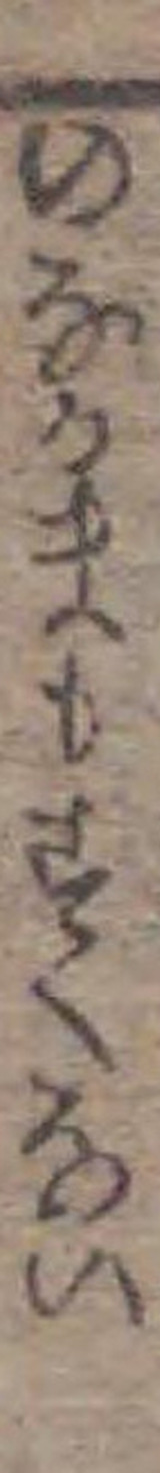のなかまもすくない
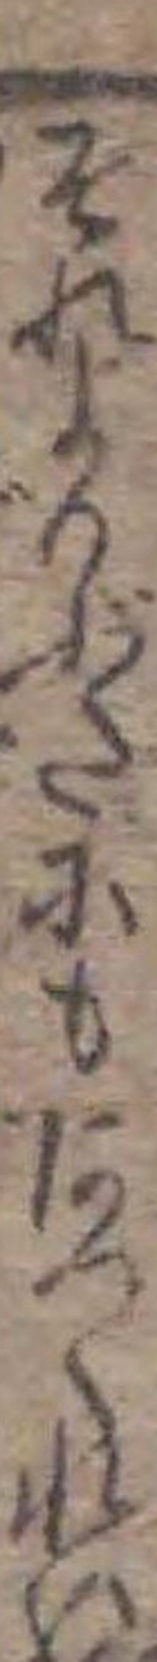それよりぶたにもあつくれいを
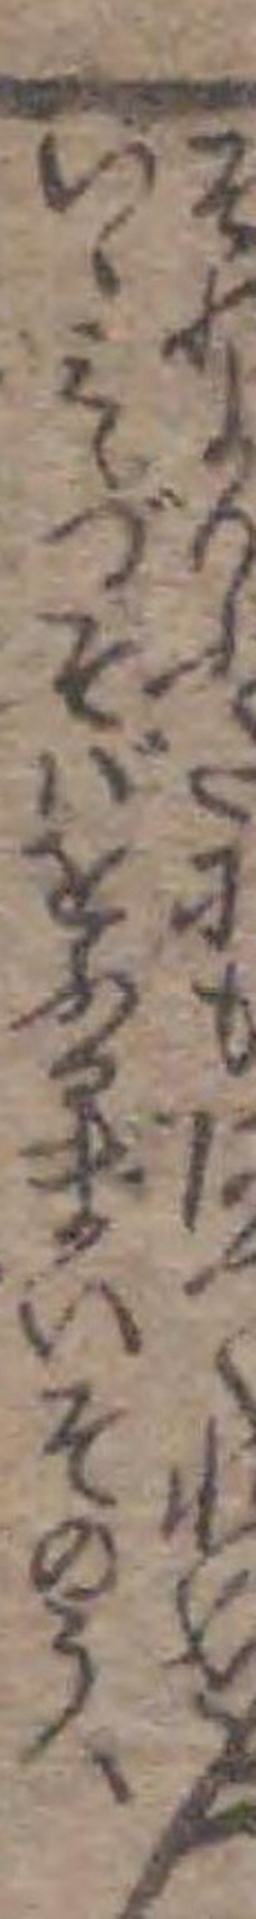いゝみゝづそばをふるまいそのうへ
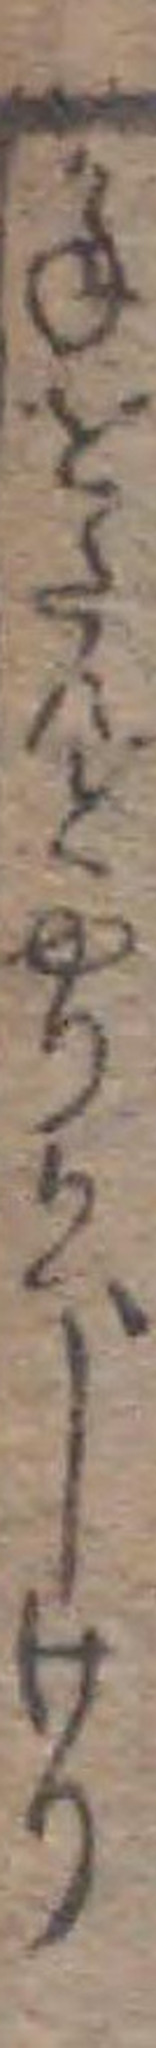かねをたんとやりかへしけり
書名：化物七段目 : 2巻
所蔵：国立国会図書館 National Diet Library, JAPAN
